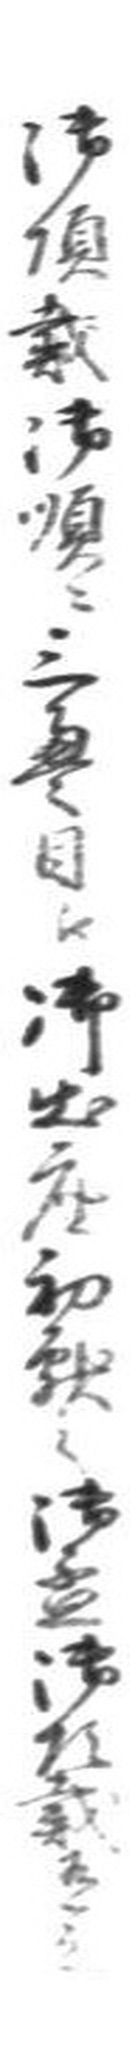御頂戴御順ニ三畳目江御出座初献之御盃御頂戴有之
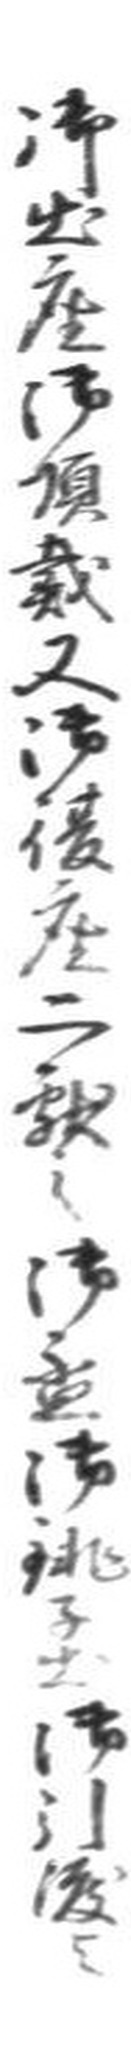御出座御頂戴又御復座二献之御盃銚子出御引渡与

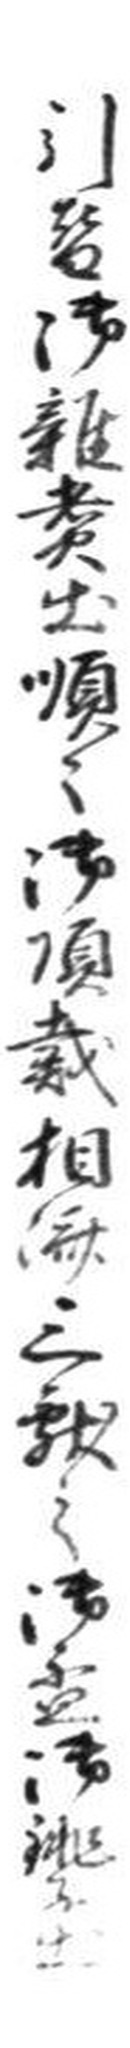引替御雑煮出順々御頂戴相済三献之御盃御銚子出
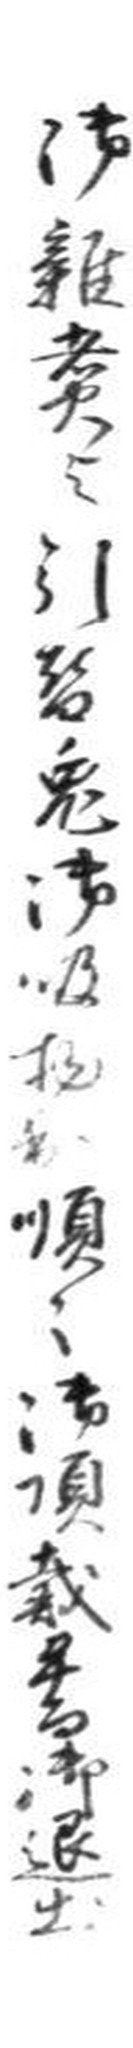御雑煮与引替兎御吸物出順々御頂戴畢而御退出
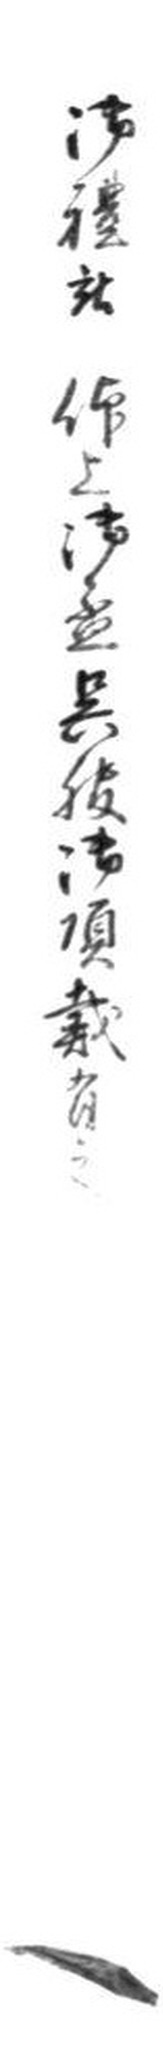御礼被仰上御盃呉服御頂戴有之
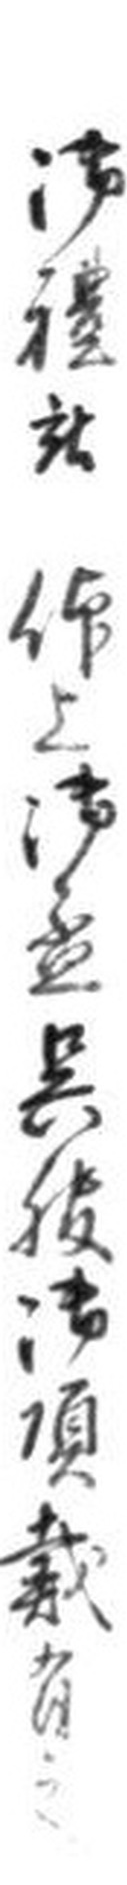御礼被仰上御盃呉服御頂戴有之
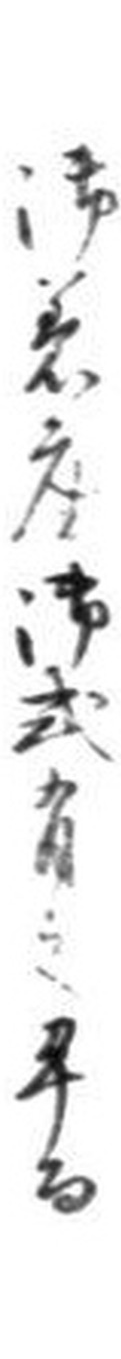御着座御式有之畢而
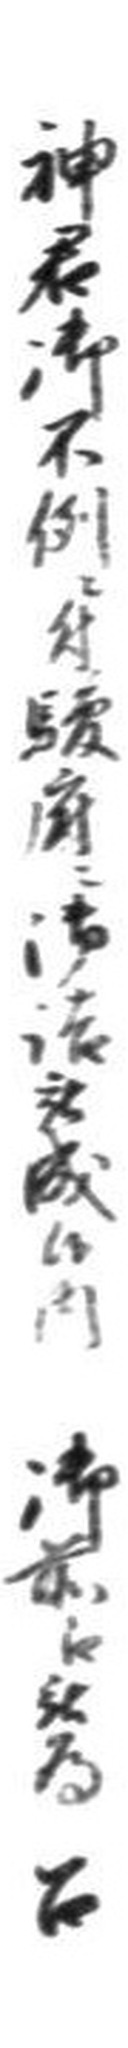神君御不例ニ付駿府ニ御詰被成候内御前江被為召
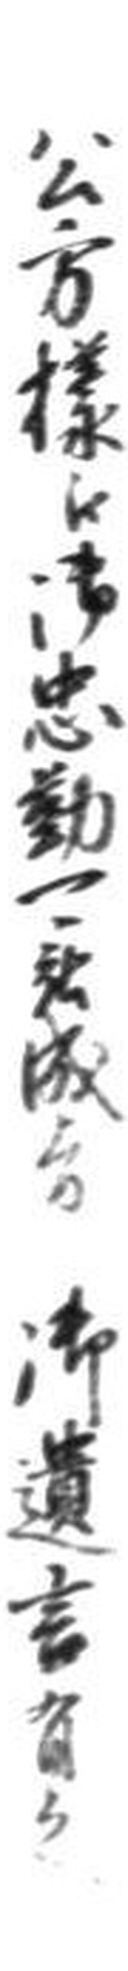公方様江御忠勤可被成旨御遺言有之
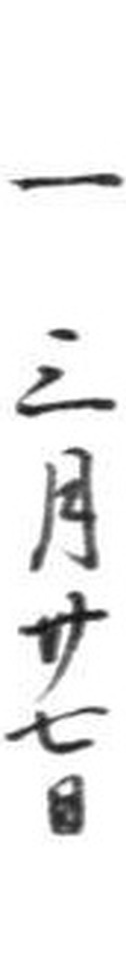一三月廿七日
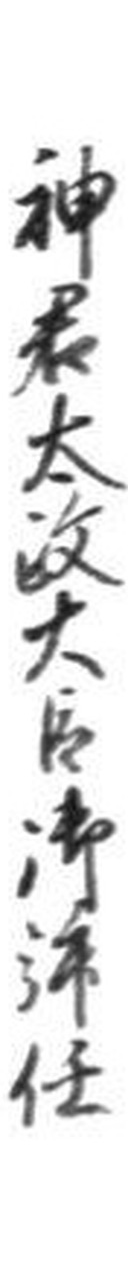神君太政大臣御拝任
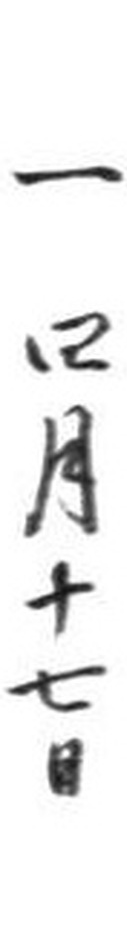一四月十七日
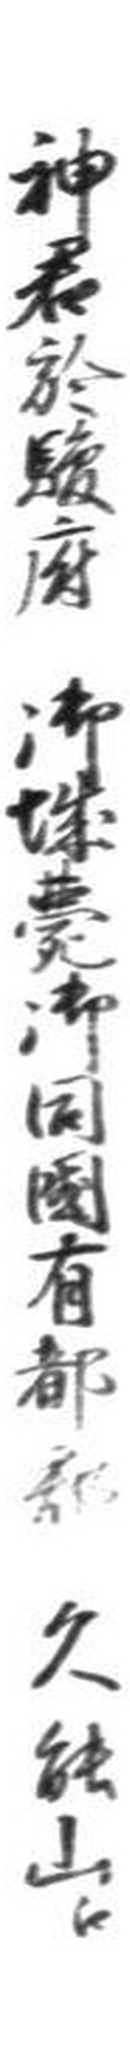神君於駿府御城薨御同国有都郡久能山江

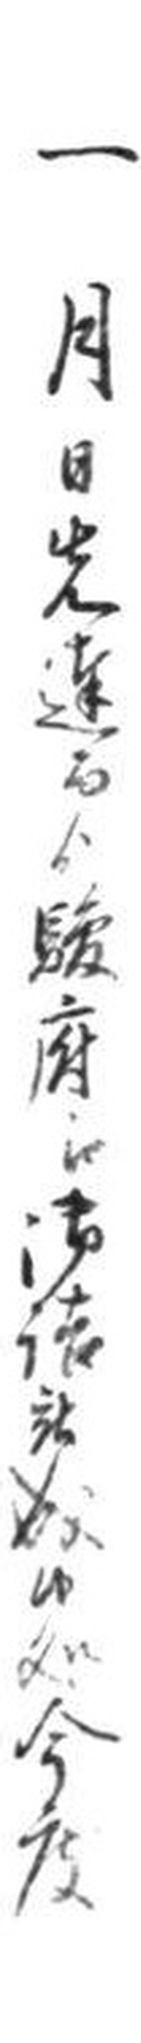一月日先達而ゟ駿府江御詰被成候処今度
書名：家譜 二 忠直公 従文禄四年到慶安四年
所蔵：福井県文書館 Fukui Prefectural Archives
